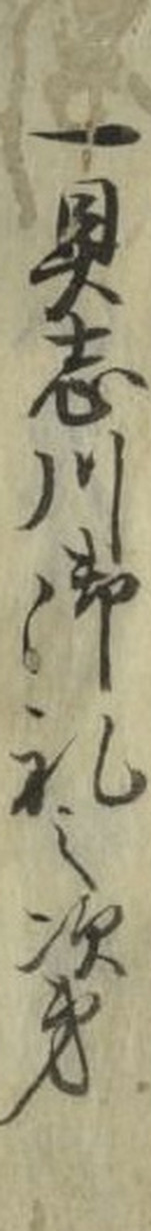一具志川御礼之次第
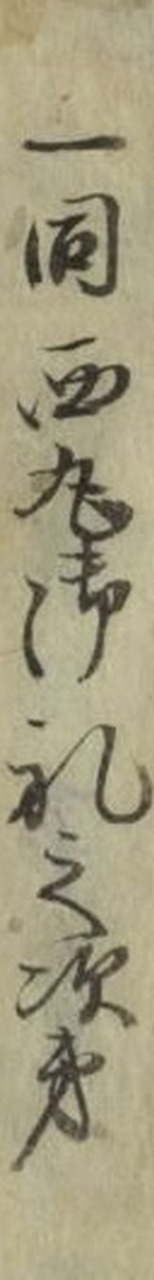一同西丸御礼之次第
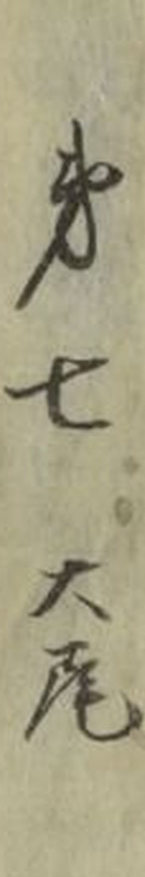第七大尾
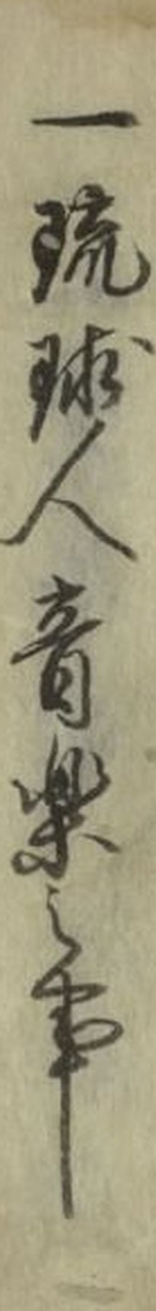一琉球人音楽之事
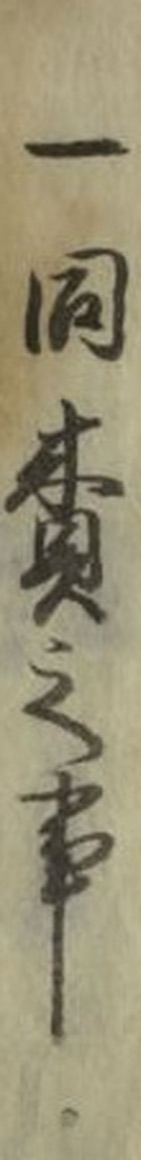一同賚之事

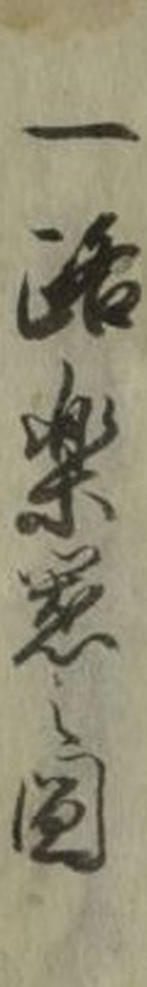一路楽器之図
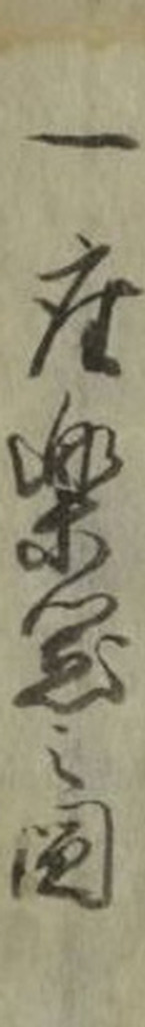一座楽器之図
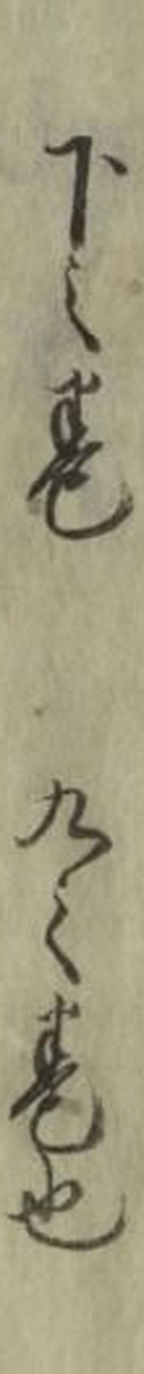下之巻九之巻也
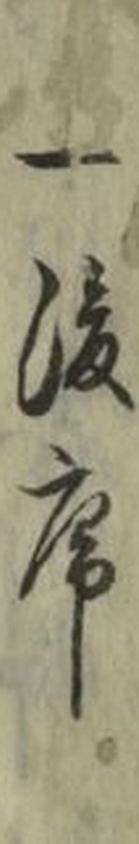一後序
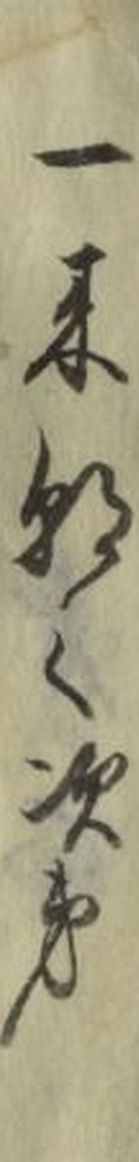一来朝之次第
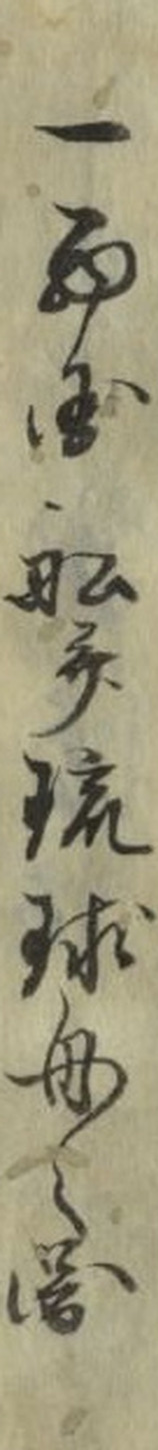一西国舩幷琉球舟之図
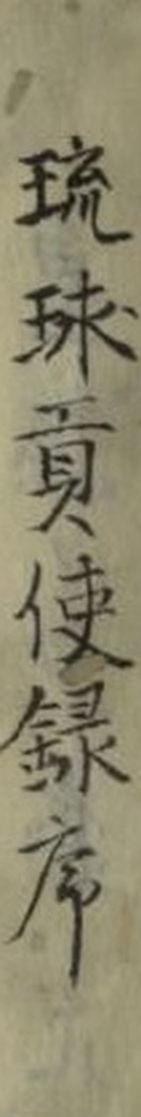琉球貢使録序
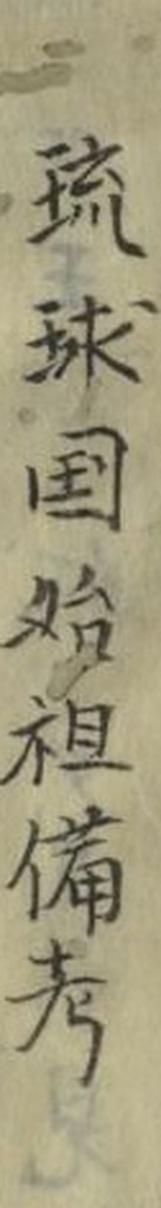琉球国始祖備考
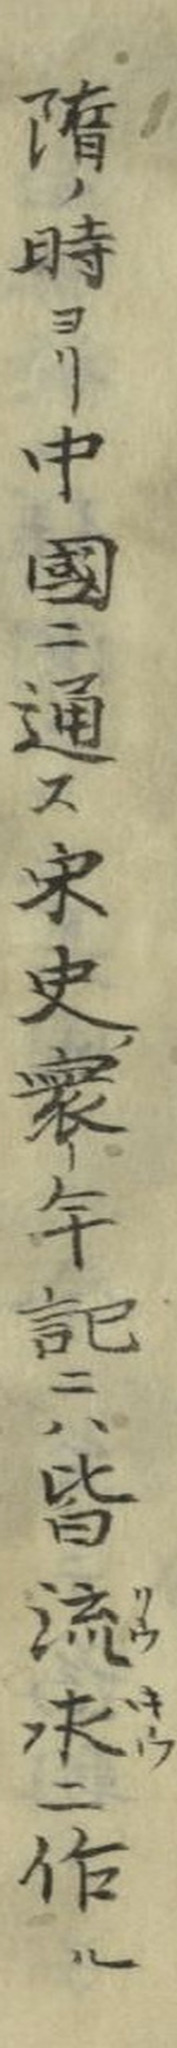隋の時より中国に通す宋史の寰宇記には皆流求に作る
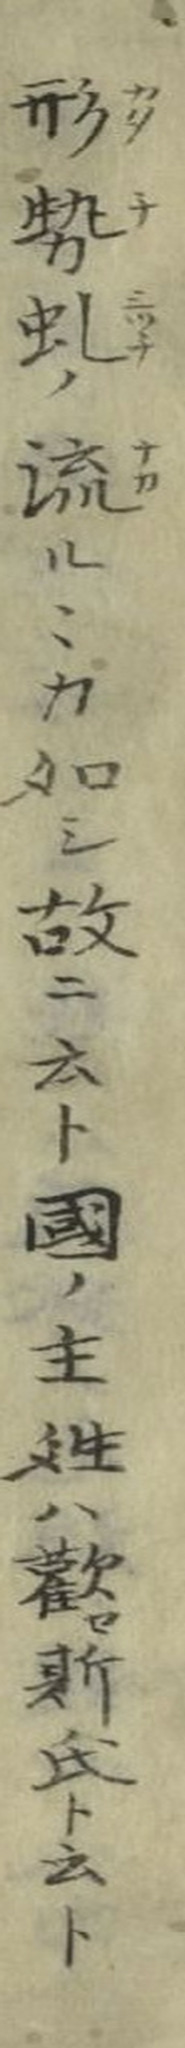形勢虬の流るゝか如し故に云うと国の主姓は歡セ斯氏と云と
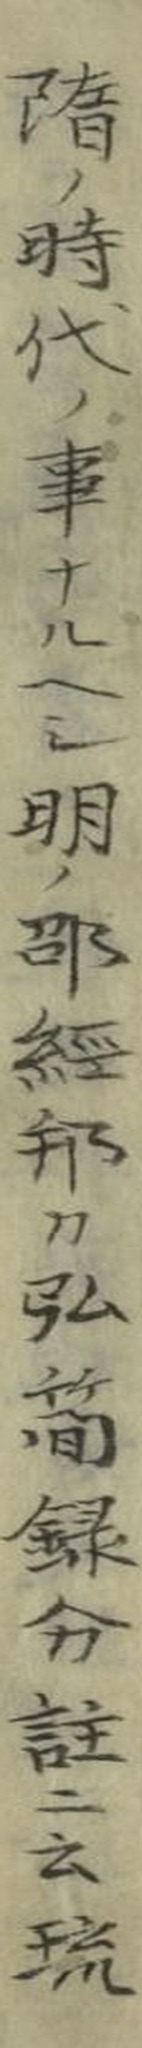隋の時代の事なるへし明の邵經邦か弘簡録分註に云流
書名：琉球人来朝之記
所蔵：University of the Ryukyus Library
